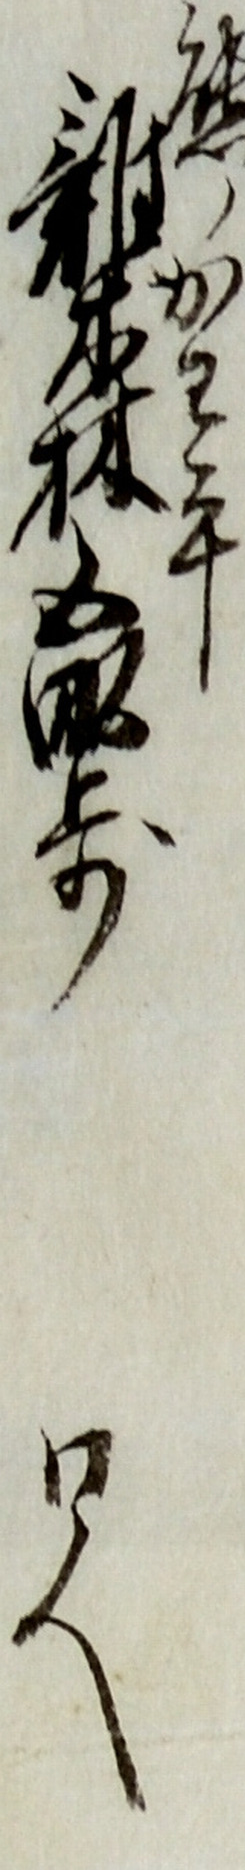雑木林五畝歩同人

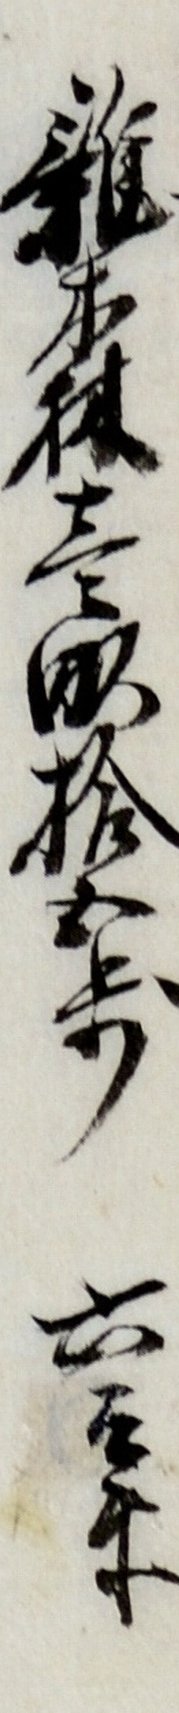雑木林壱畝拾五歩六兵衛
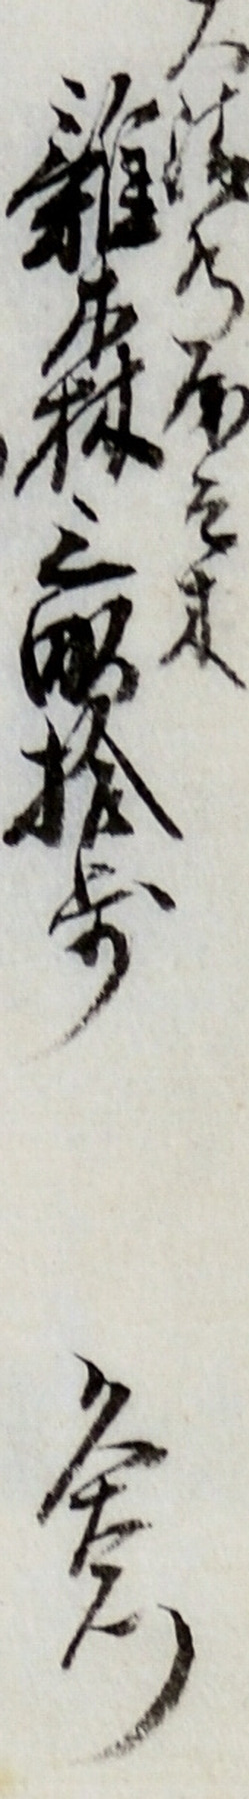雑木林三畝拾歩久右衛門
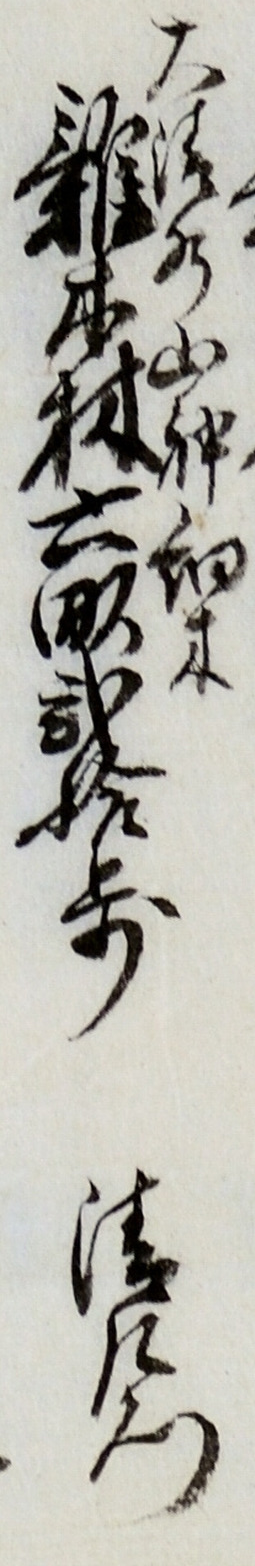雑木林六畝弐拾歩清左衛門
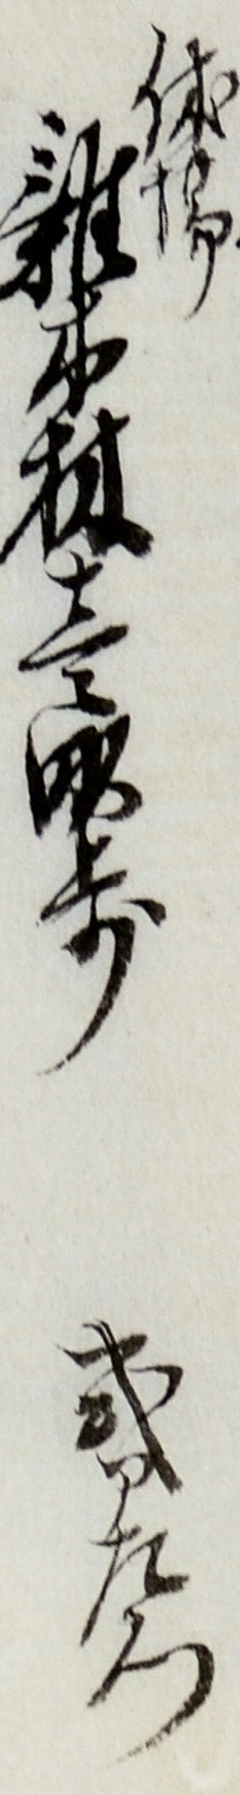雑木林壱畝歩式部左衛門
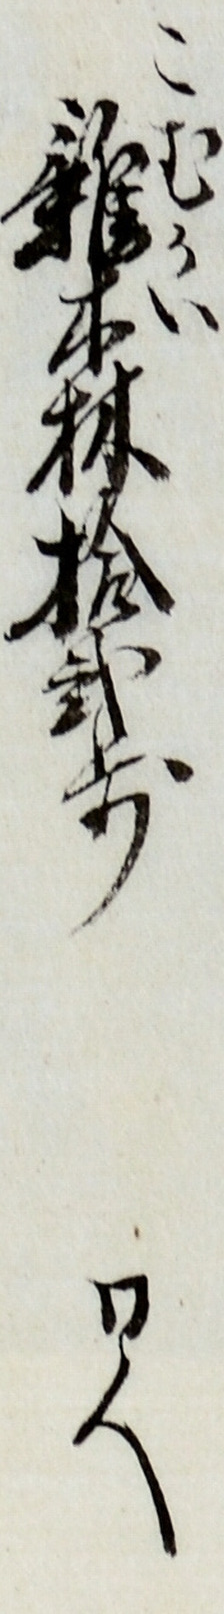雑木林拾弐歩同人
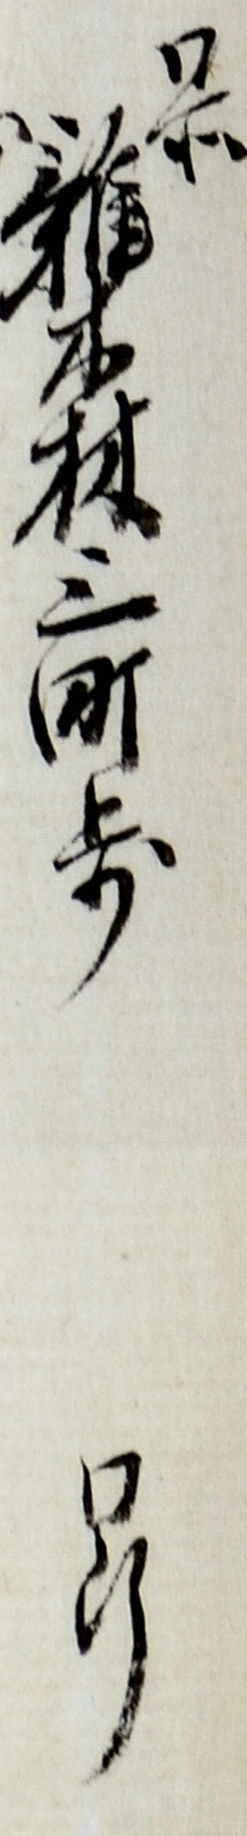雑木林三町歩同断
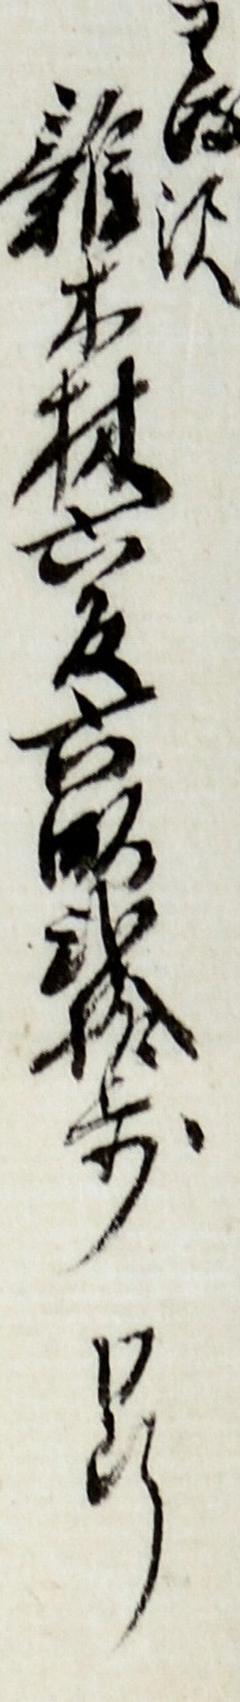雑木林六反六畝弐拾歩同断
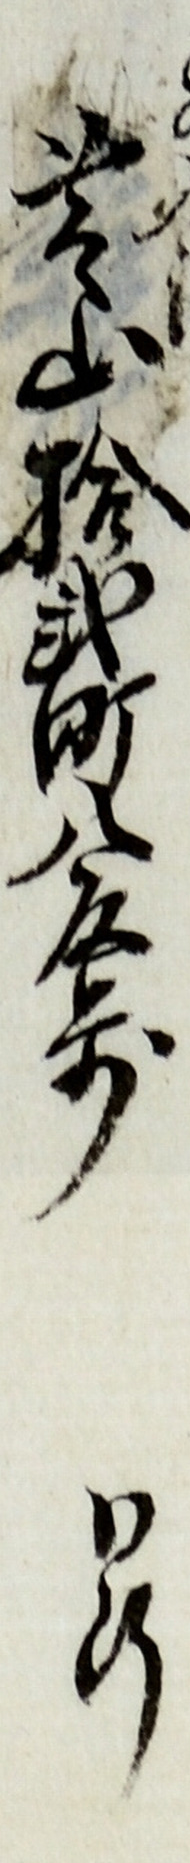芝山拾弐町八反歩同断
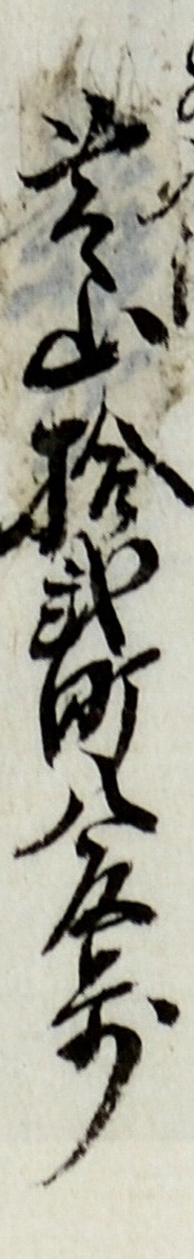芝山拾弐町八反歩同断
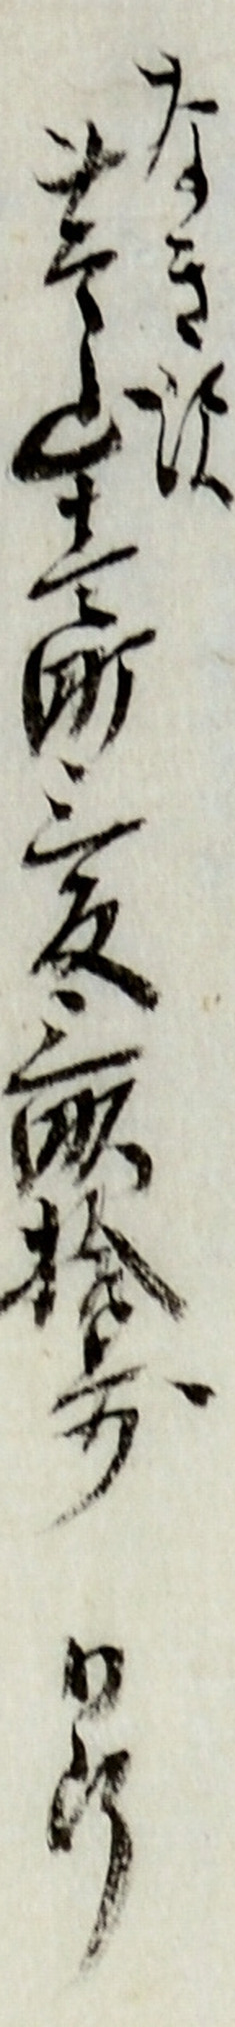芝山壱町三反三畝拾歩同断
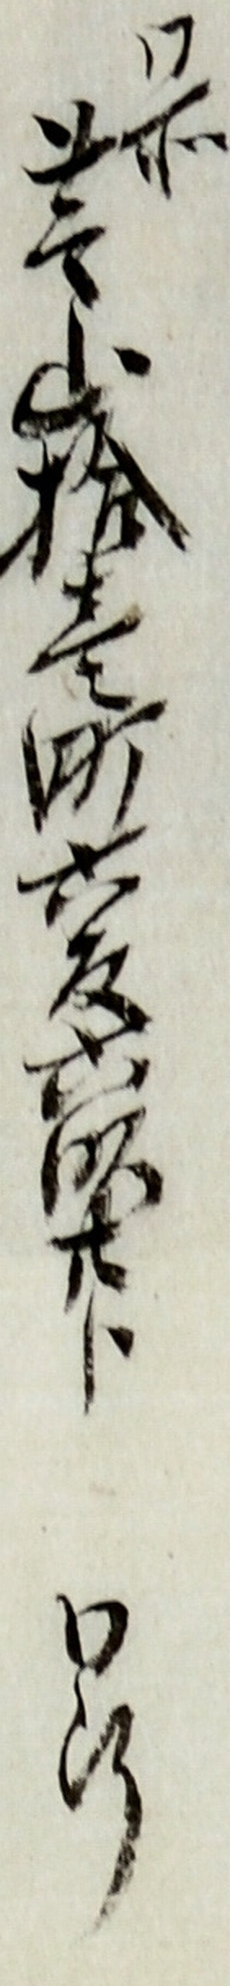芝山拾壱町六反六畝廿歩同断
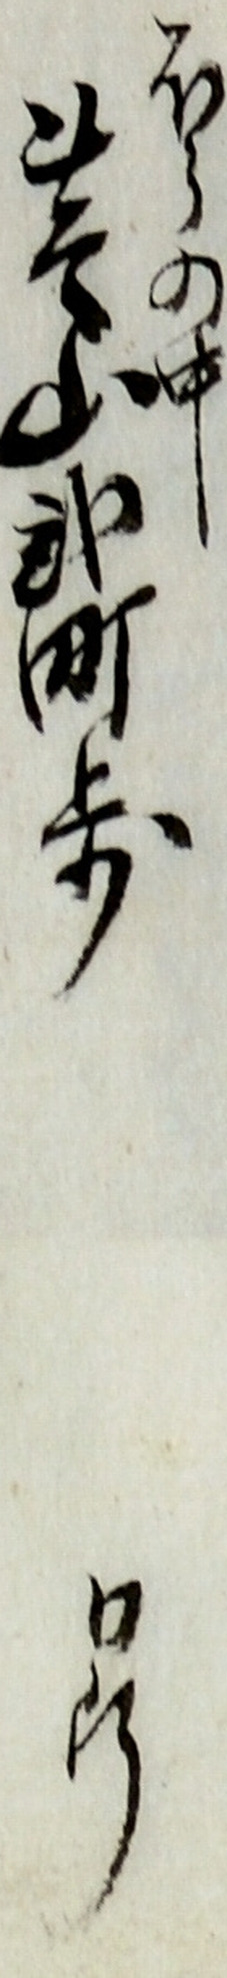芝山弐町歩同断
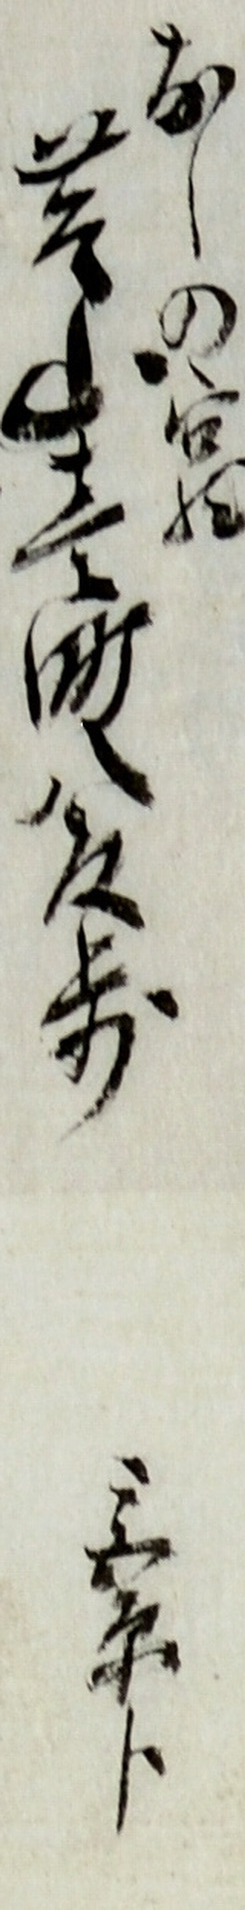芝山壱町八反歩宮原分
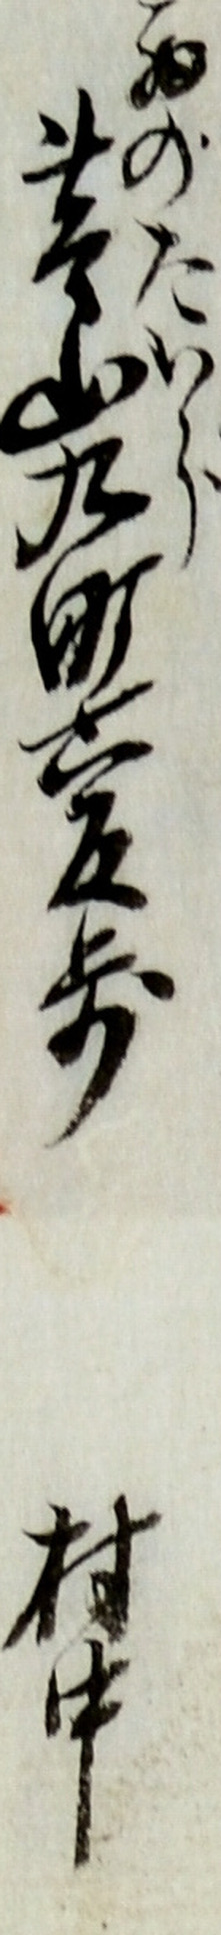芝山九町六反歩村中

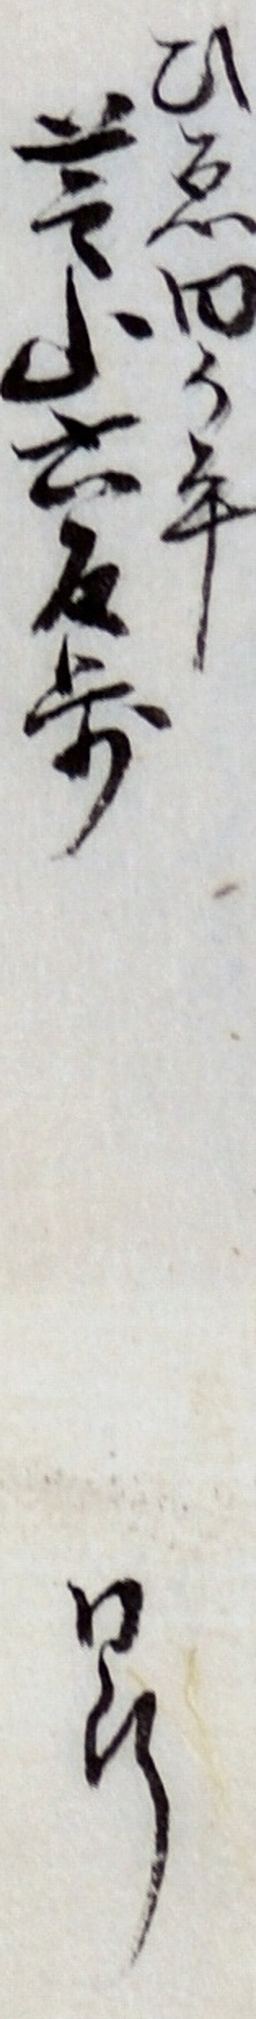芝山六反歩同断
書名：御領分中山林社地手控
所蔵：伊那市立高遠町図書館・合同会社AMANE
